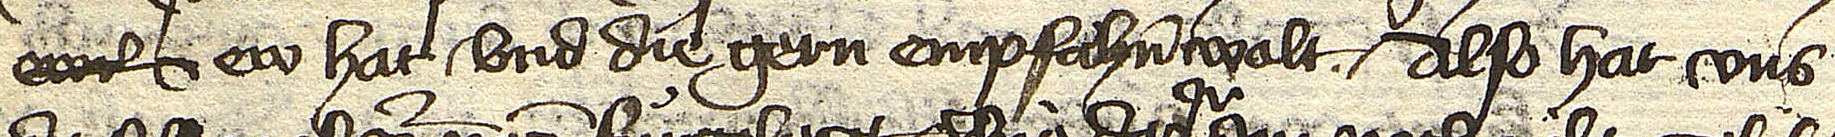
ewr* ew hat / vnd die gern empfahn* wolt . / Alſo hat vns
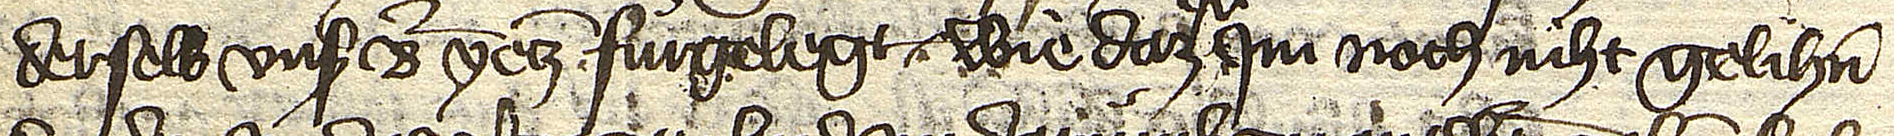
derſelb vnſ* B* yecʒ* fürgelegt / wie daʒ Im noch niht gelihn*
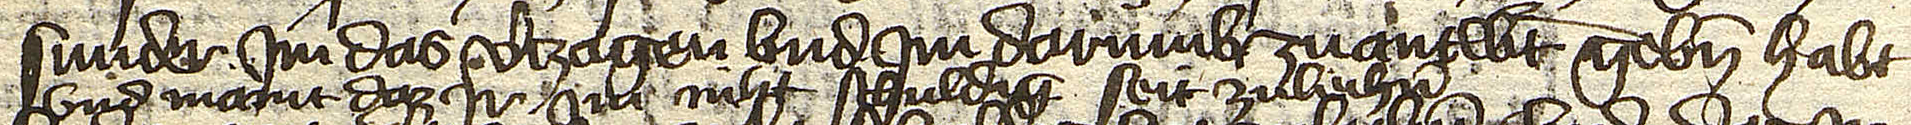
ſunder Im das v*cʒogen vnd Im darümb cʒuantw*t gebn* habt
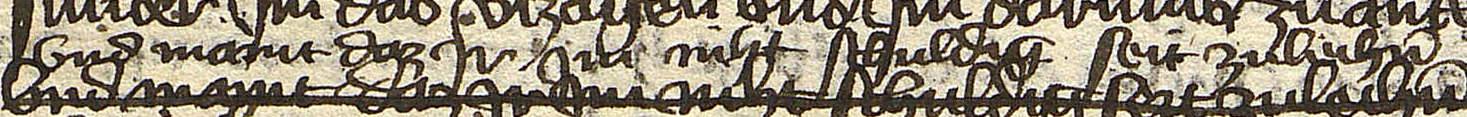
vnd maint daʒ Ir Im niht ſchuldig ſeit ʒuleihn*
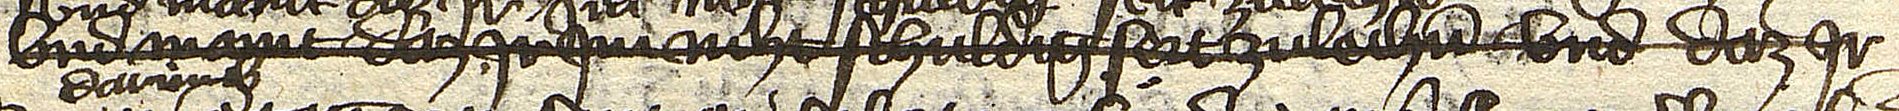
vnd maint / daʒ Ir Im niht ſchuldig ſeit cʒuleihn* / vnd daʒ Ir
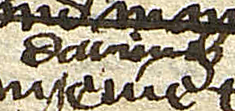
darumb
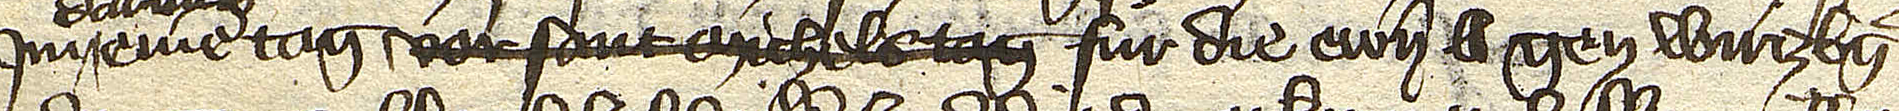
Im eine* tag vor ſant Michels tag für die ewn* b gen wircʒbg*
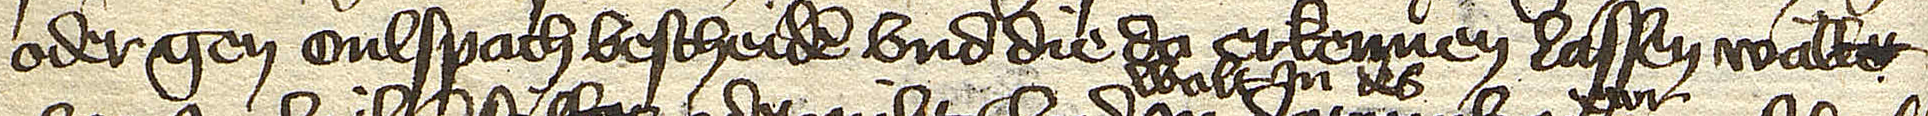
oder gen Onlſpach beſcheid* vnd die do erkennen laſſen wöllet
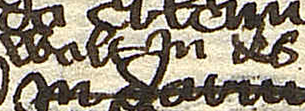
wolt In des
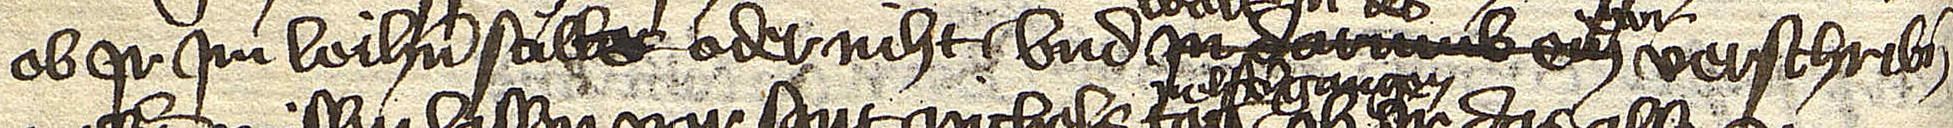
ob Ir Im leihn* ſöllet oder niht / vnd In darumb ein verſchribn*
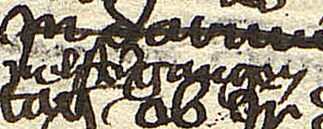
nehſv*gangen
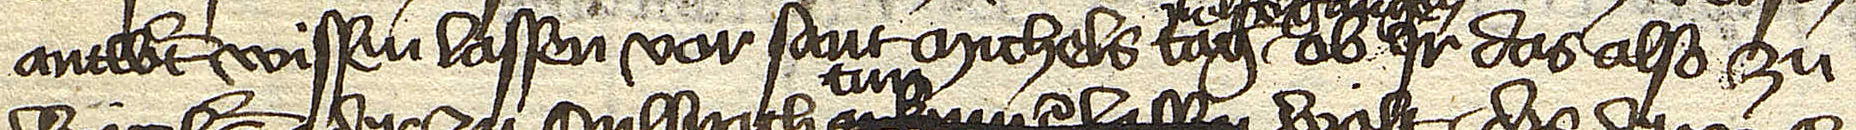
antw*t wiſſen laſſen vor ſant Michels tag / ob Ir das alſo cʒu
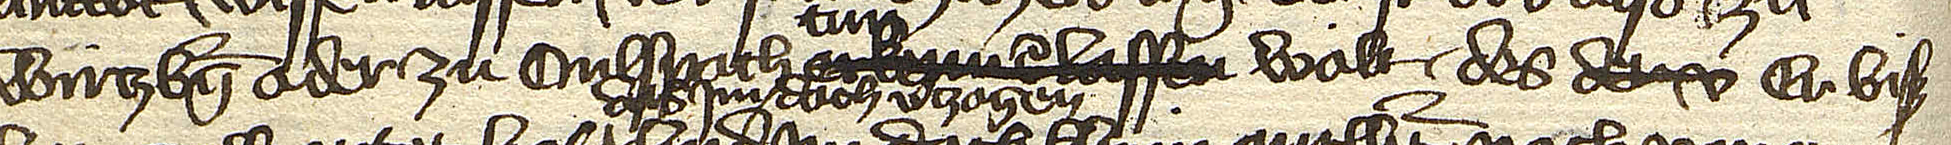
wircʒbg* oder cʒu Onlſpach erkenne* laſſen wölt / des der v Er biſʒ
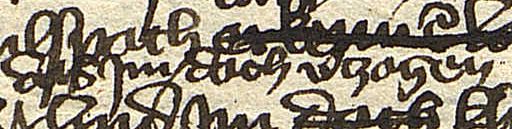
das Im doch v*cʒogen
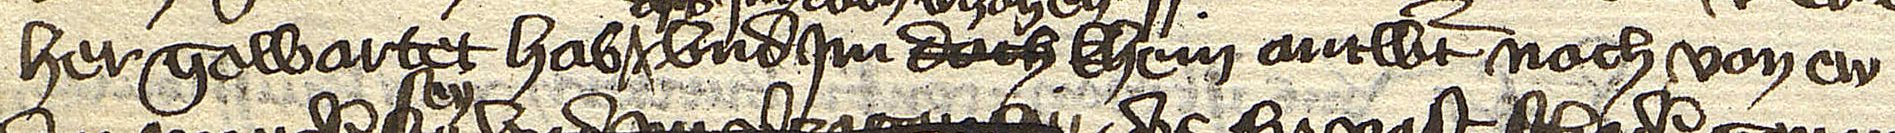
her gewartet hab / vnd Im doch khein antw*t noch von ew
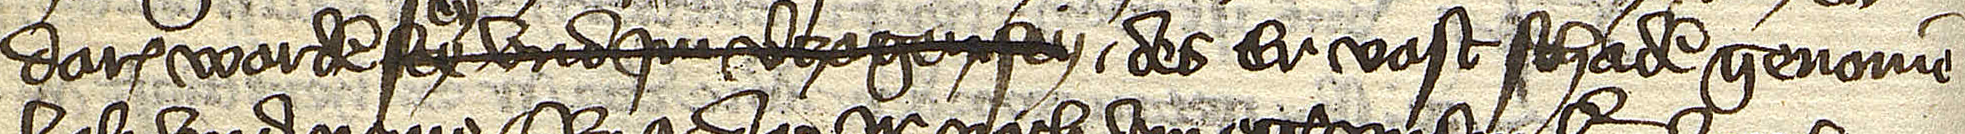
dar* word* ſey vnd Im v*cʒogen ſey / des er vaſt ſchad* genome*
